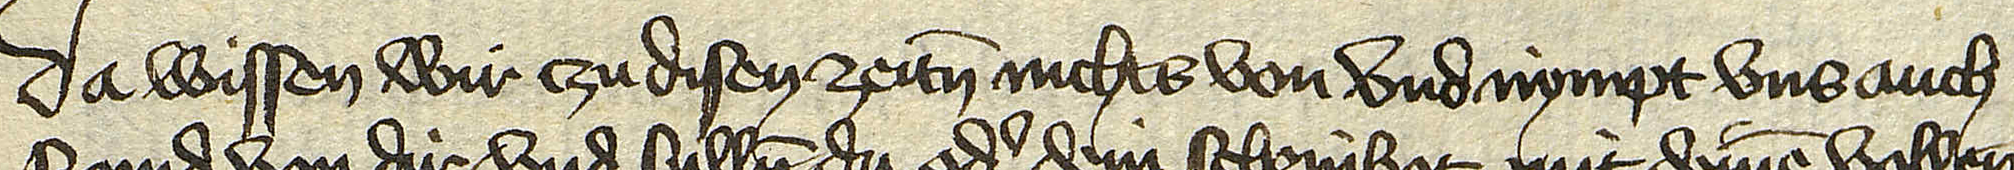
da wiſſen wir cʒu diſen cʒeitn* nichts von vnd nympt vns auch
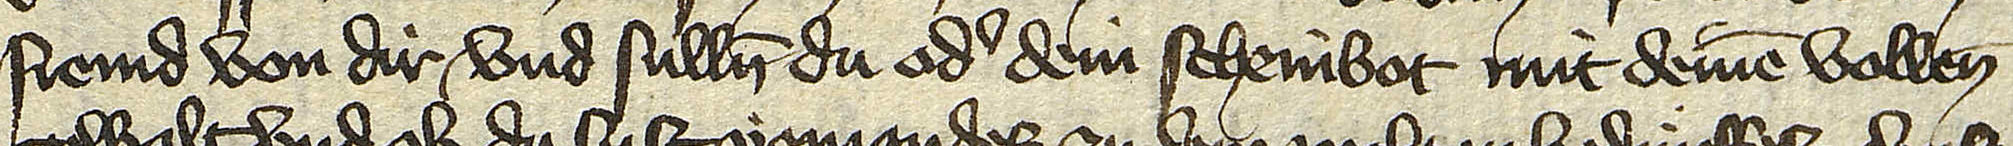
fremd von dir / vnd ſülln* du od* dein ſcheinbot mit deine* vollen
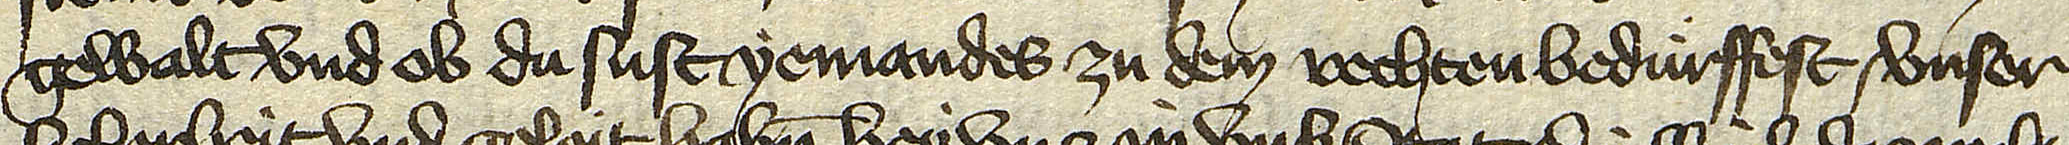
gewalt vnd ob du ſuſt yemandes cʒu dem rechten bedürffeſt / vnſer
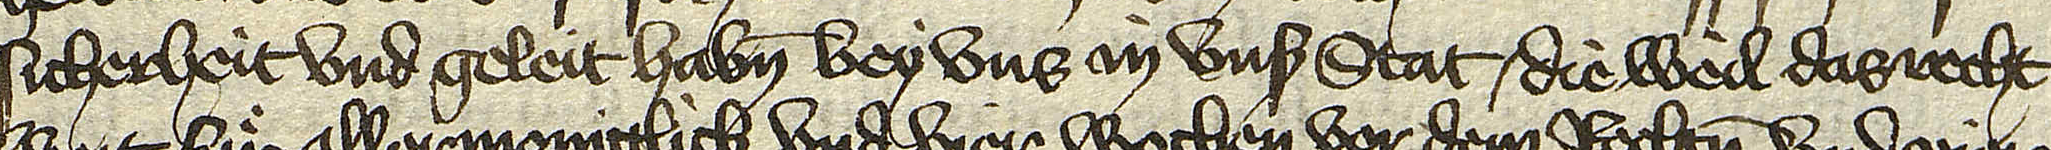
ſicherheit vnd geleit habn* bey vns in vnſ* Stat / dieweil das recht
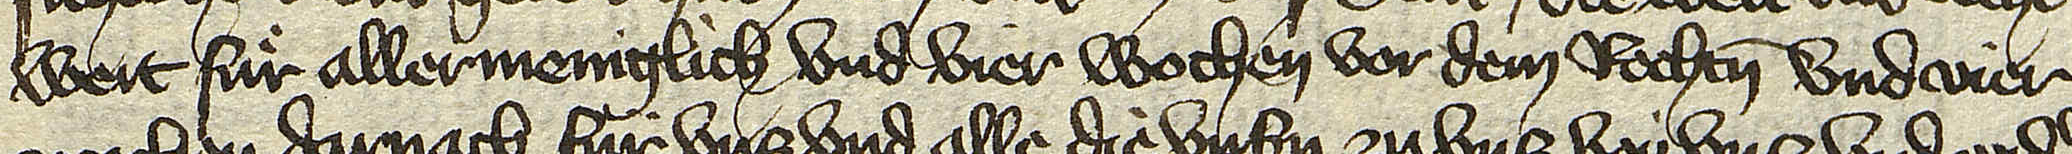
wert für allermeniglich vnd vier wochen vor dem Rechtn* vnd vier
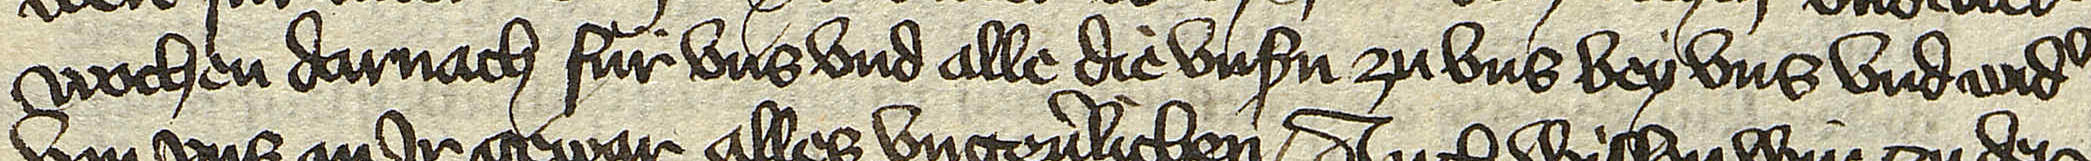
wochen darnach für vns vnd alle die vnſ*n cʒu bey vns vnd wid*
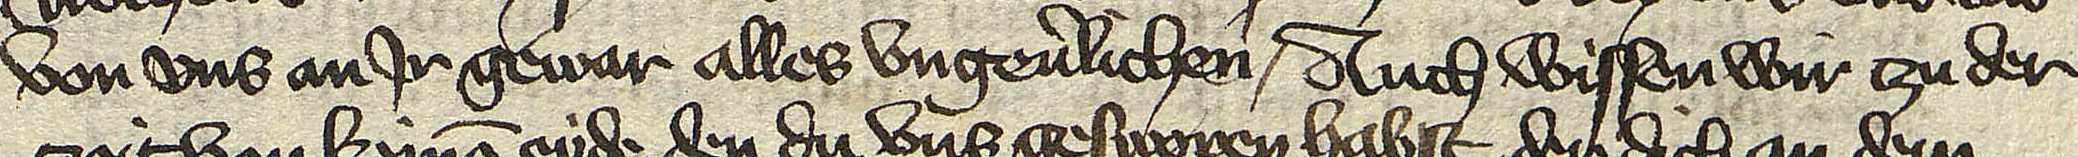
von vns an Ir gewar alles vngeu*lichen / Auch wiſſen wir cʒu der
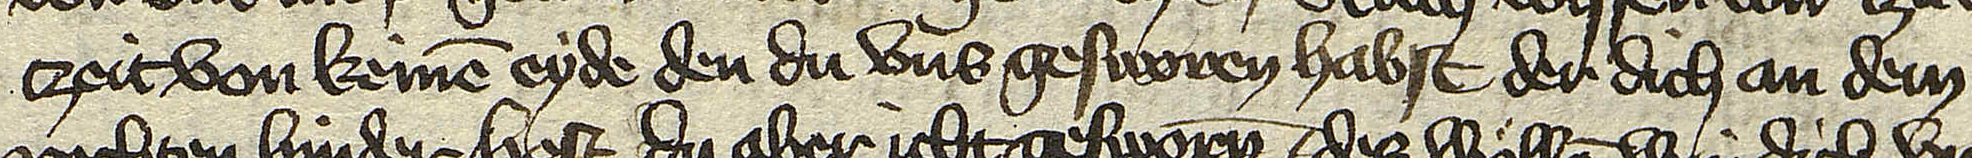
cʒeit von keine* eyde den du vns geſworen habſt der dich an dem
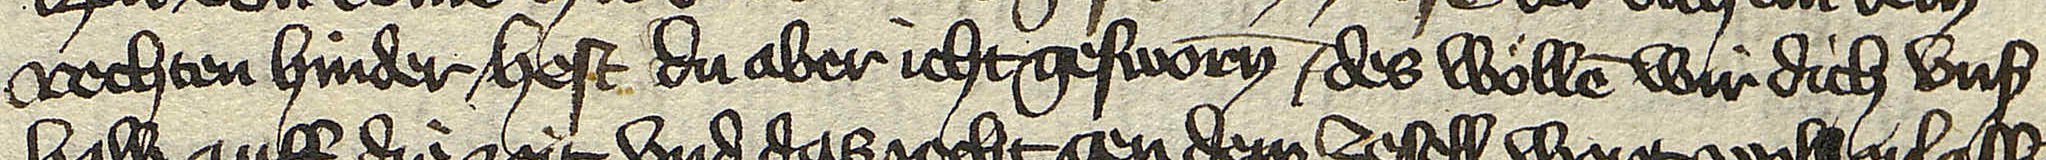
rechten hinder / heſt du aber icht geſworn* / des wölle* wir dich vnſ*
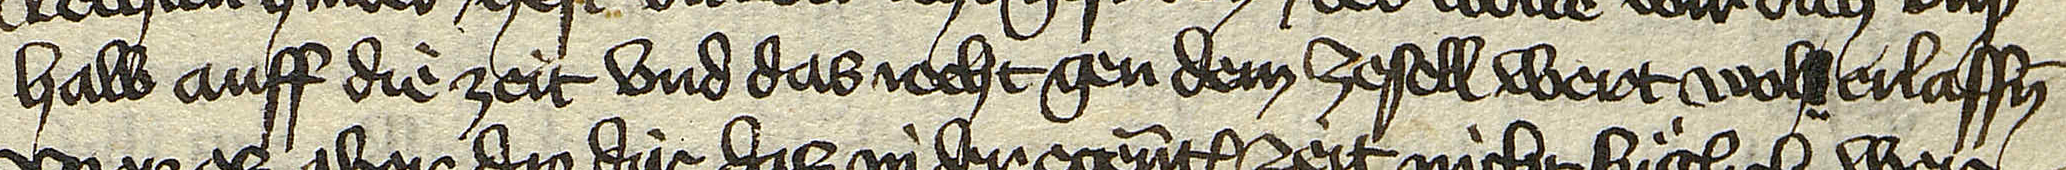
halb auff die cʒeit vnd das recht gen dem cʒeſell wert wol erlaſſn*
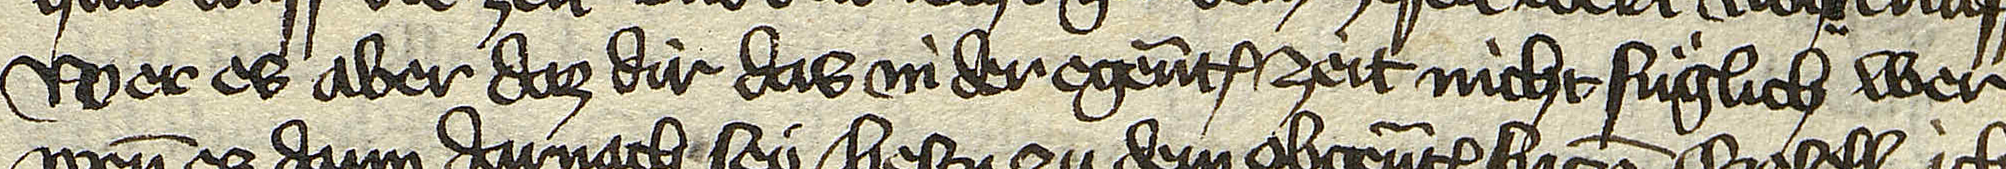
Wer es aber daʒ dir das in der egent* cʒeit nicht füglich wer
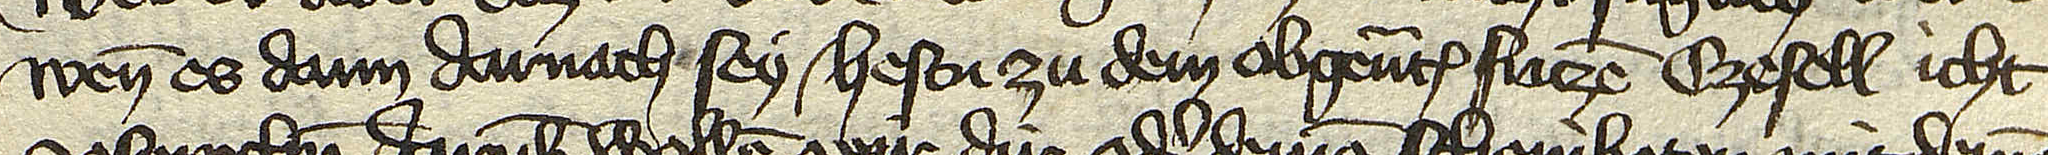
wen* es dann darnach ſey / heſtu cʒu dem obgent* fricʒe* Cʒeſell icht
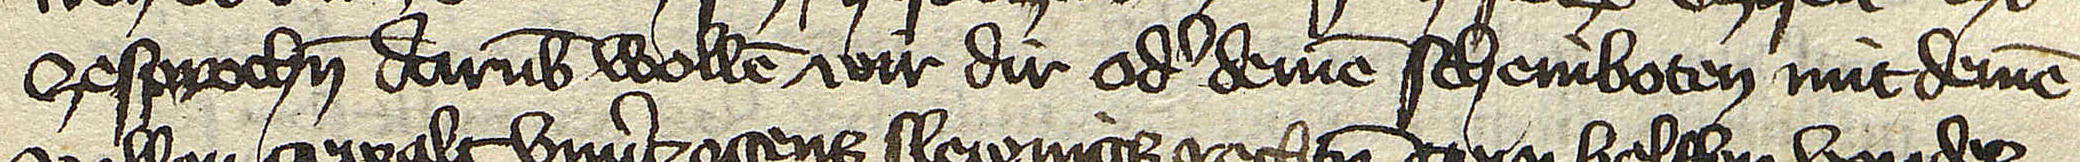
cʒeſprochn* darub* wolle* wir dir od* deine* ſcheinboten mit deine*
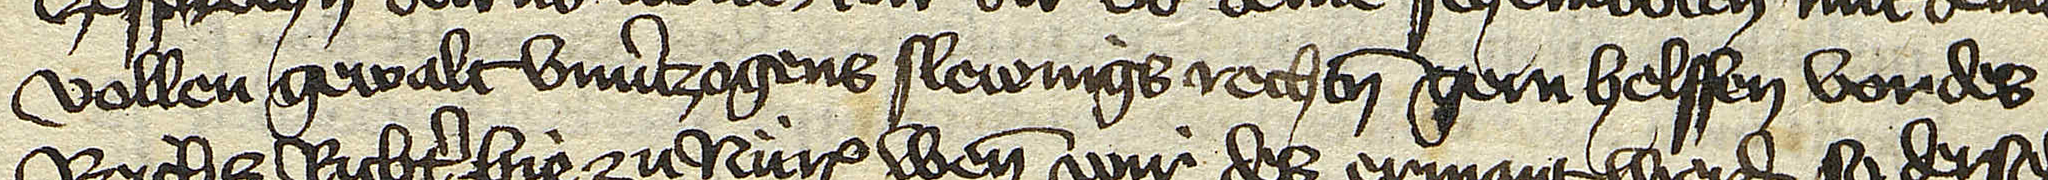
vollen gewalt vnu*cʒogens ſlewnigs rechtn* gern helffen vor des
